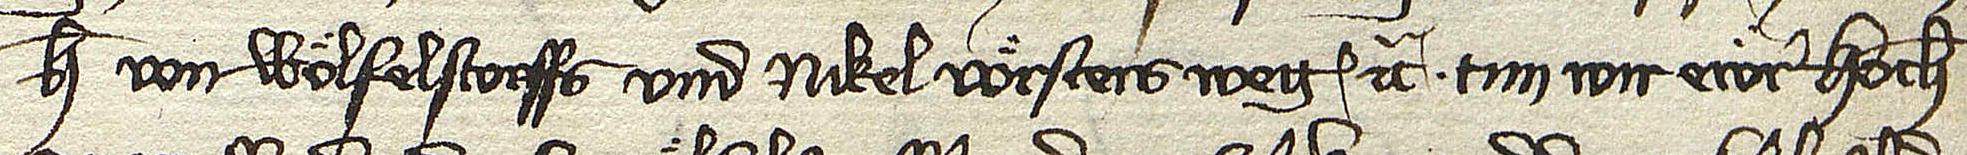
H* von Wölfelſtorffs vnd Nikel vörſters weg* ec* . tun wir ew*r Hoch*
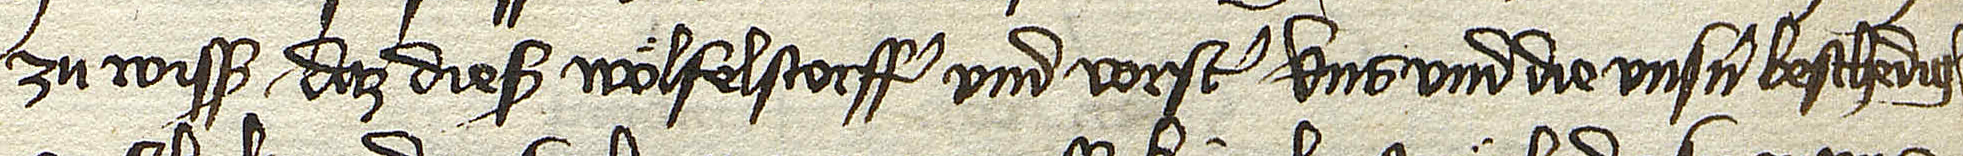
ʒu wiſſ* / daʒ dieſ* wölfelſtorff* vnd vorſt* Vns vnd die vnſ*n beſchedig*
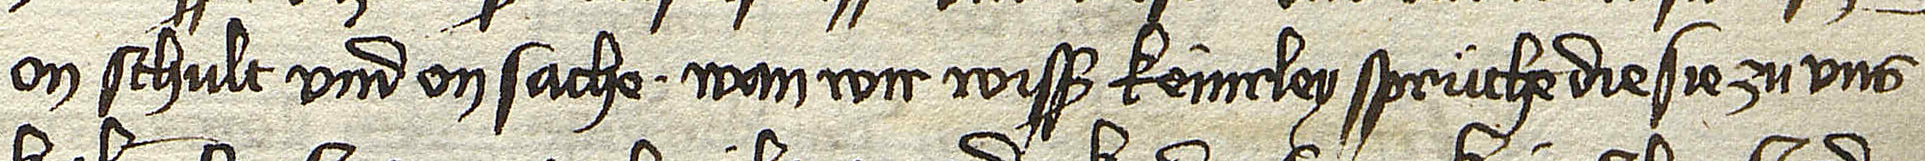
on ſchult vnd on ſache . wan wir wiſſ* keinrley ſprüche die ſie ʒu vns
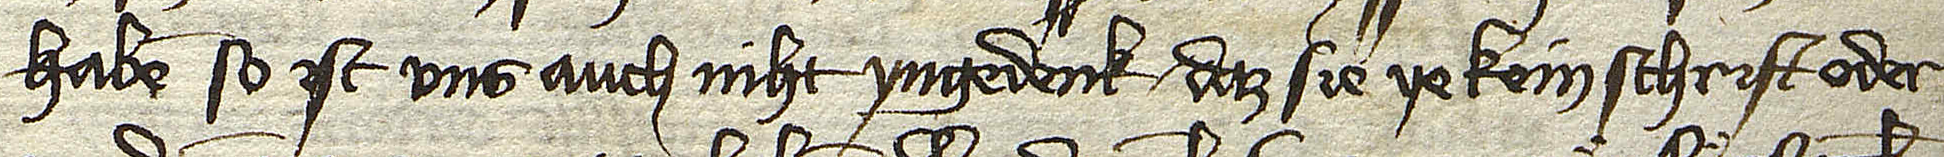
habe* ſo iſt vns auch niht yngedenk / daʒ ſie ye kein ſchrift oder
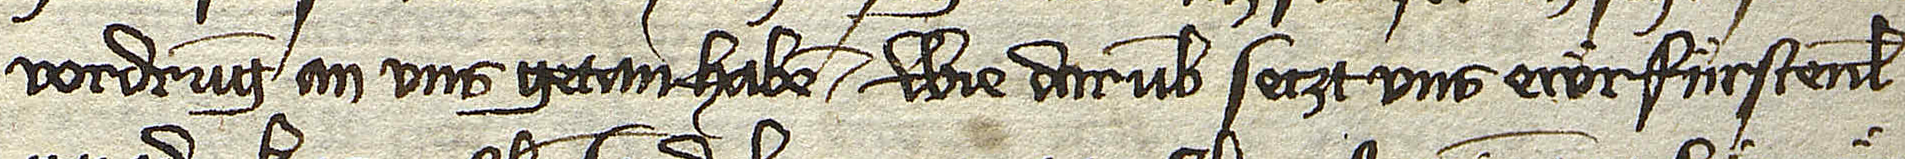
vordru*g an vns getan habe* / Wie daru*b ſecʒt vns ewr fürſtenl*
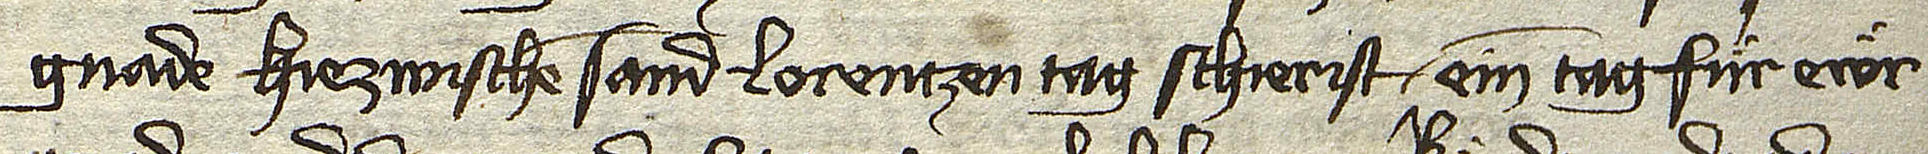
gnade hieʒwiſche* ſand Lorencʒen tag ſchieriſt / ein* tag für ewr
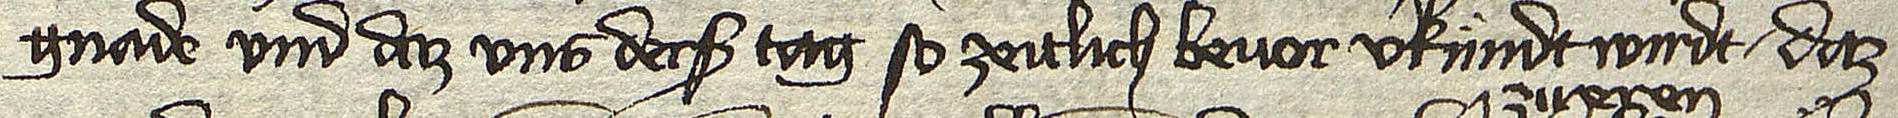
gnade vnd daʒ vns derſ* tag ſo ʒeitlich beuor v*kündt wurdet / Daʒ
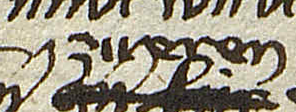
ʒueren
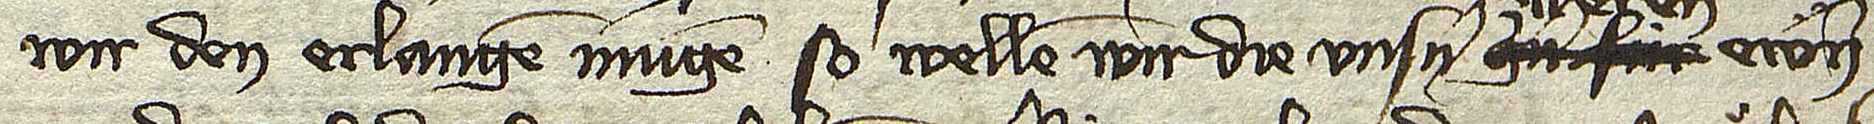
wir den erlange* muge* . ſo welle* wir die vnſ*n g*n für ew*n
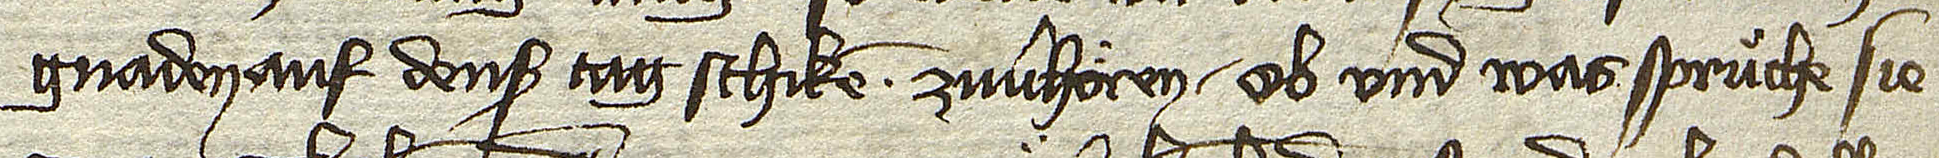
gnaden auf denſ* tag ſchike* . ʒuu*hören / Ob vnd was ſprüche ſie
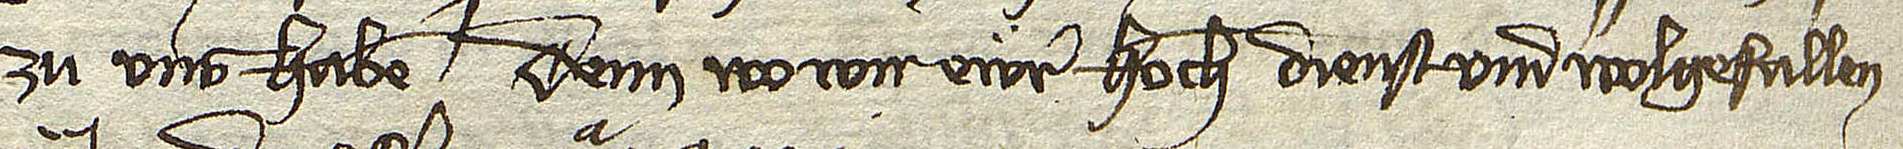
ʒu vns habe* Denn wo wir ew*r hoch* dienſt vnd wolgefallen
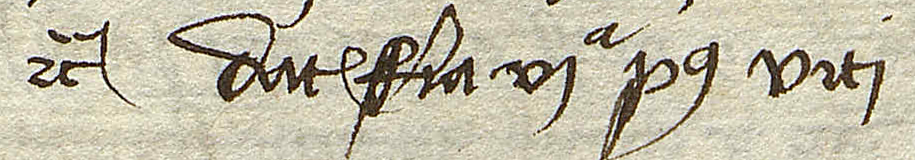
ec* Dat* fia* vi* p* viti
